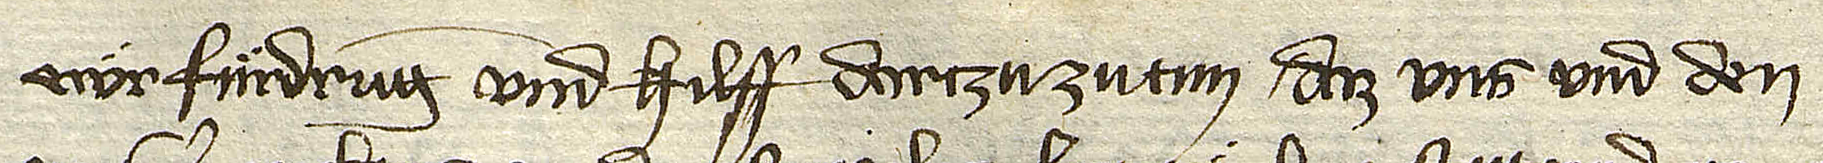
ewr fürdru*g vnd hilff darcʒu ʒu tun / daʒ vns vnd den
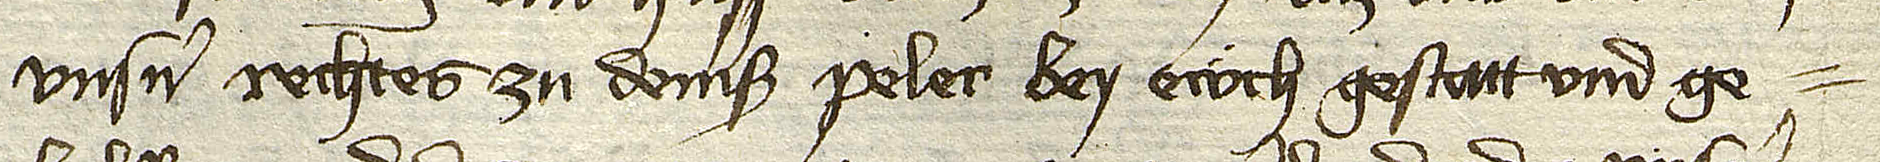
vnſ*n rechtes ʒu demſ* peler bey ewch geſtatt vnd ge =
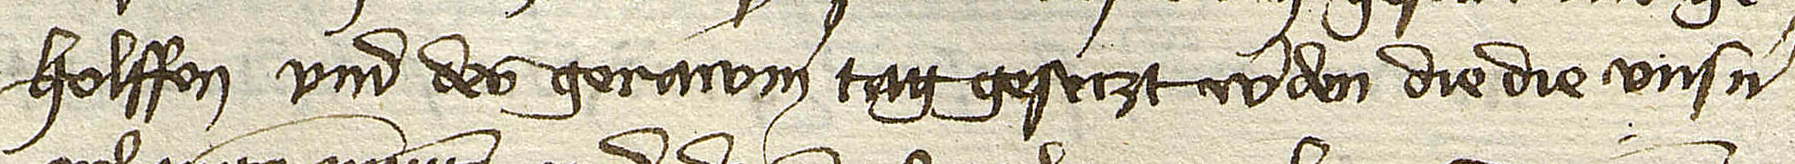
holffen vnd des gerawm tag geſecʒt w*den die die vnſ*n
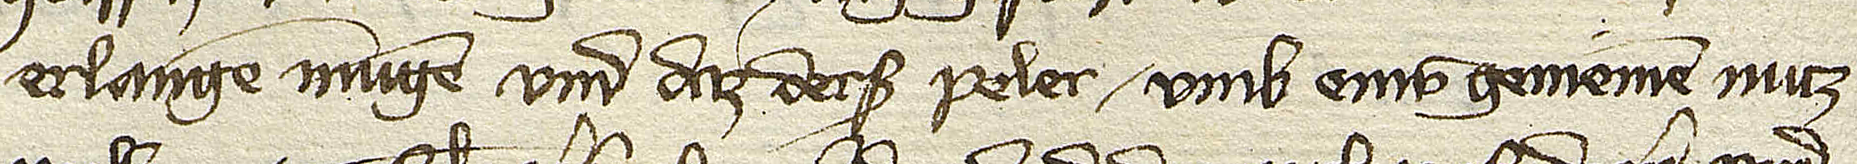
erlange* muge* vnd daʒ derſ* peler / vmb eins gemeine* nucʒ
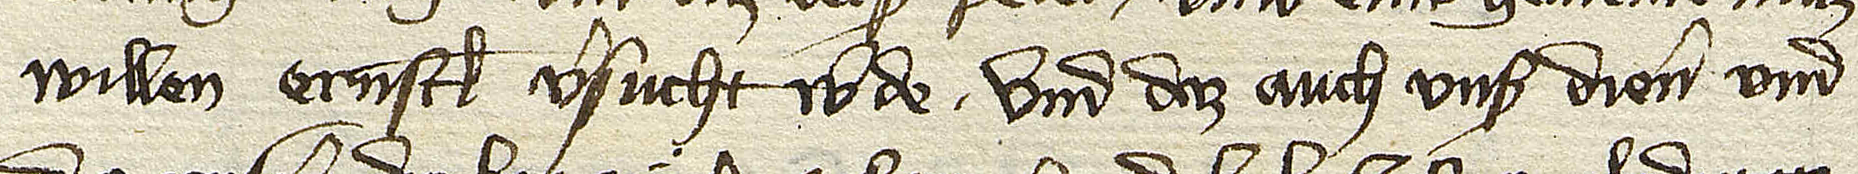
willen ernſtl* v*ſucht w*de / Vnd daʒ auch vnſ* dien* vnd
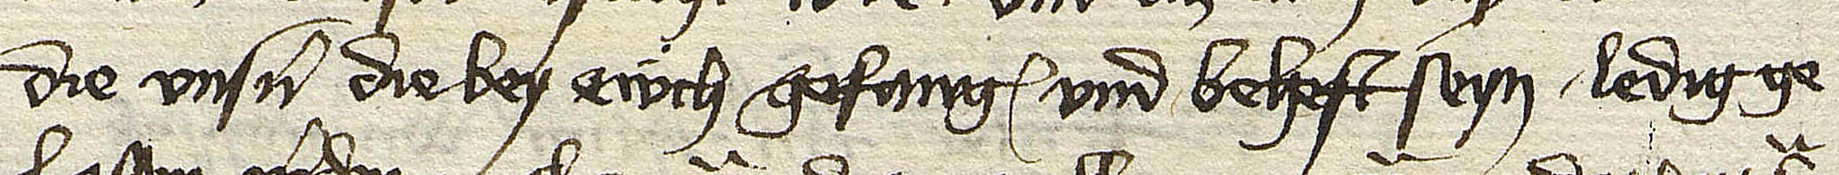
die vnſ*n die bey ewch gefang* vnd beheft ſeyn / ledig ge
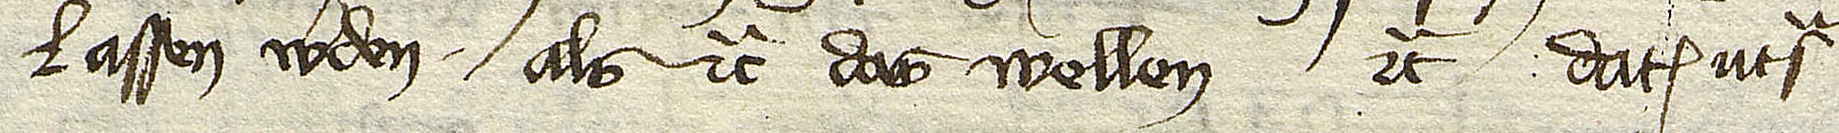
laſſen w*den . als ec* das wellen ec* / dat* ut ſ*
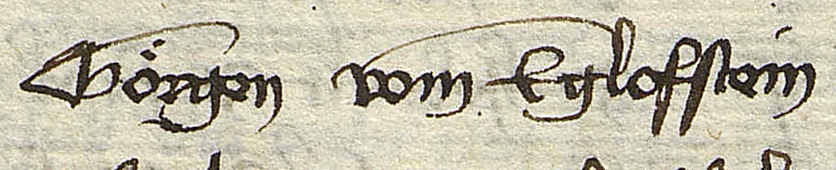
Görgen vom* Eglofſtein
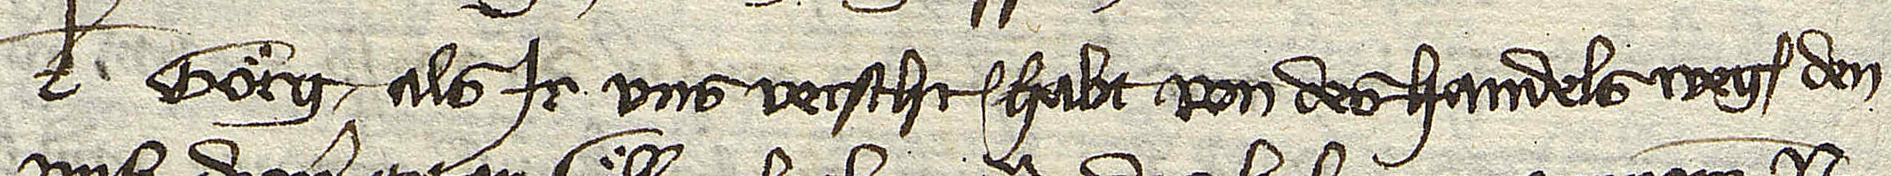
L* Görg / als Ir vns verſchr* habt von des handels weg* den
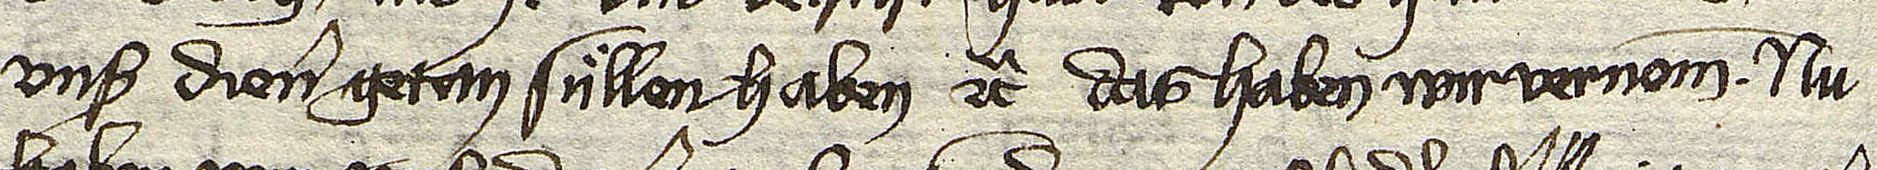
vnſ* dien* getan ſüllen haben ec* das haben wir vernom* . Nu
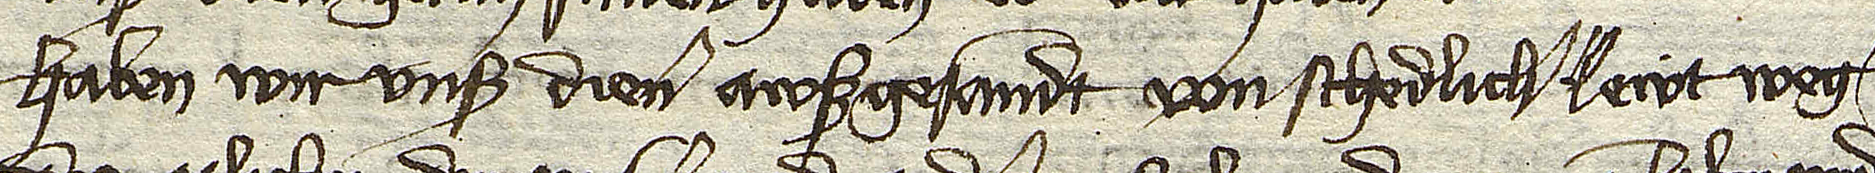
haben wir vnſ* dien* awſʒgeſandt von ſchedlich* lewt weg*
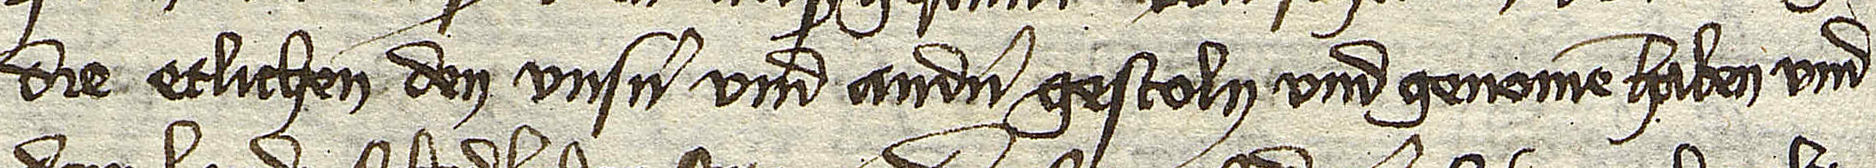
die etlichen den vnſ*n vnd and*n geſtoln vnd genome* haben vnd
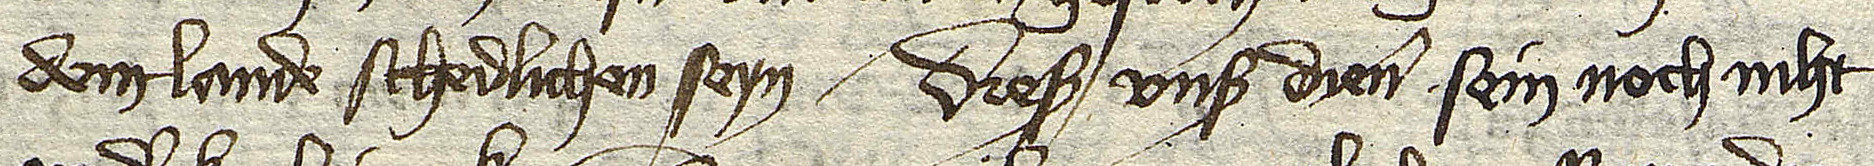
dem lande ſchedlichen ſeyn / Dieſ* vnſ* dien* ſein noch niht
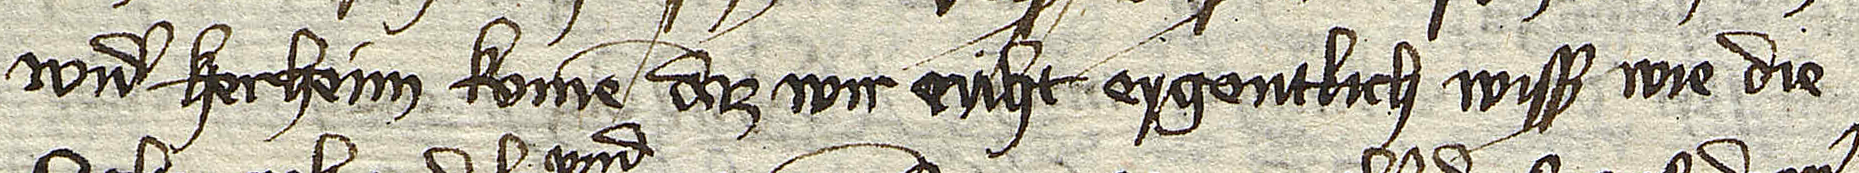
wid* herheim kome* / daʒ wir niht eygentlich wiſſ* wie die
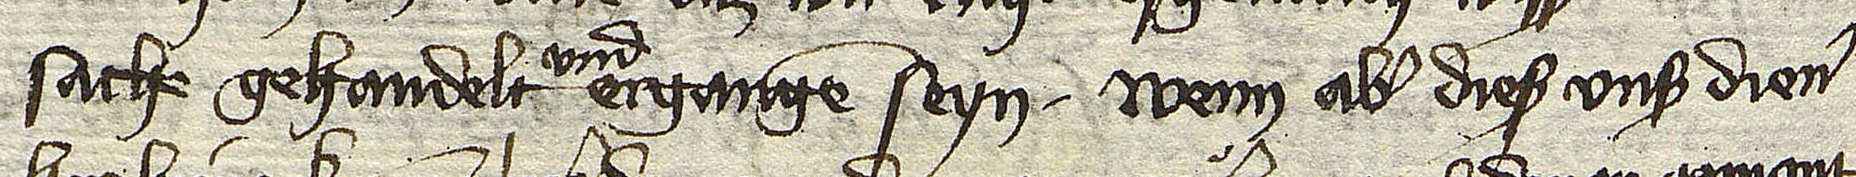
ſache gehandelt ergange* ſeyn / wenn ab* dieſ* vnſ* dien*
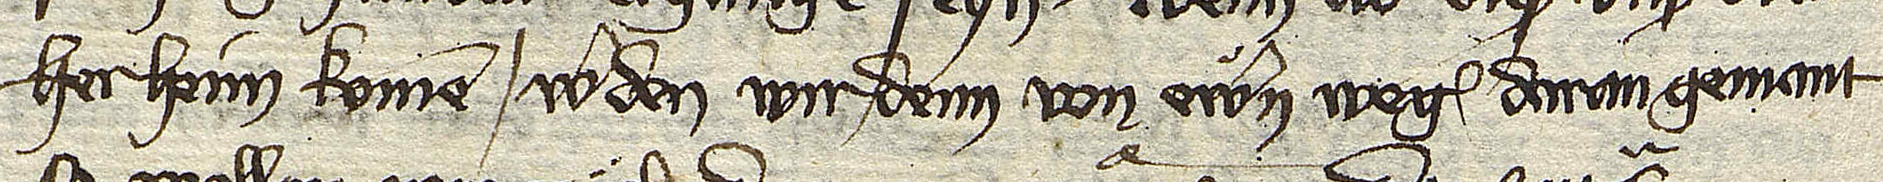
herheim kome* / w*den wir denn von ew*n weg* daran gemant
